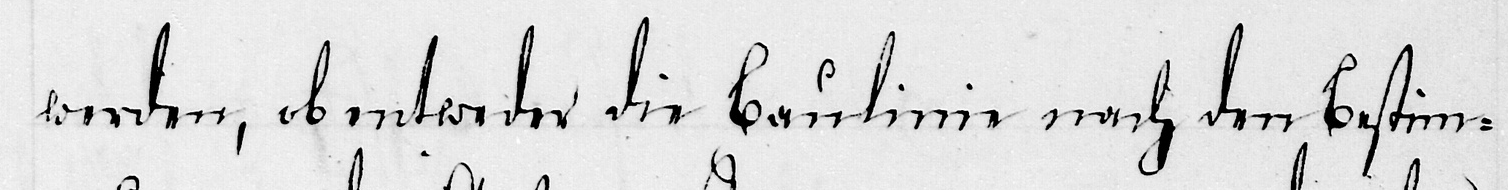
werden, ob entweder die Baulinie nach den Bestim¬
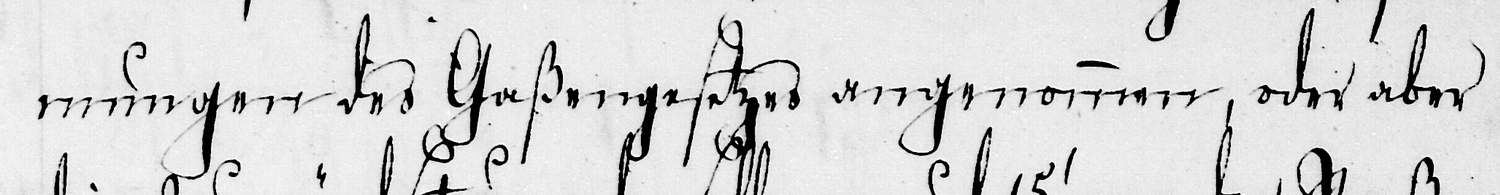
mungen des Gaßengesetzes angenommen, oder aber
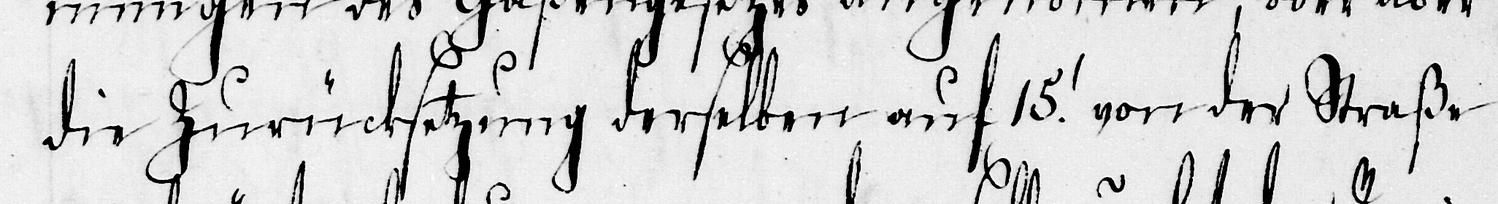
die Zurücksetzung derselben auf 15.‘ von der Straße
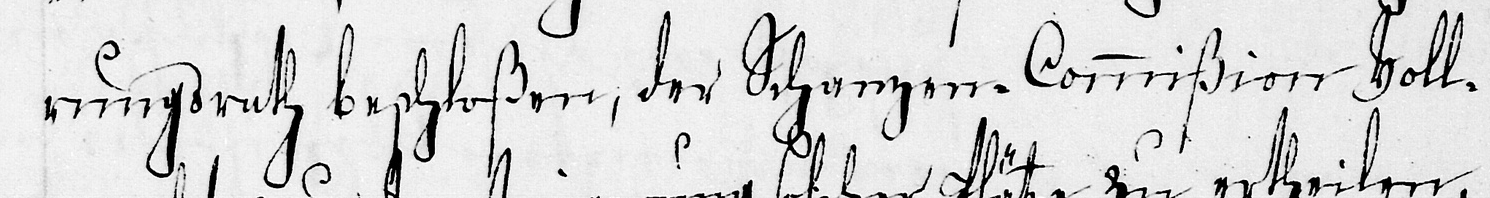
erungsrath beschloßen, der Schanzen-Commißion Voll¬
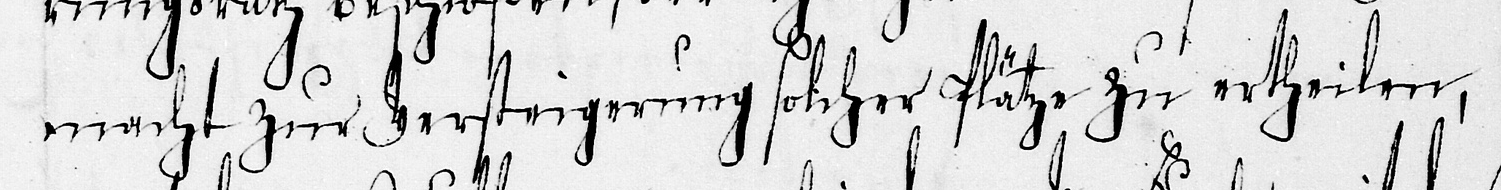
macht zur Versteigerung solcher Plätze zu ertheilen,
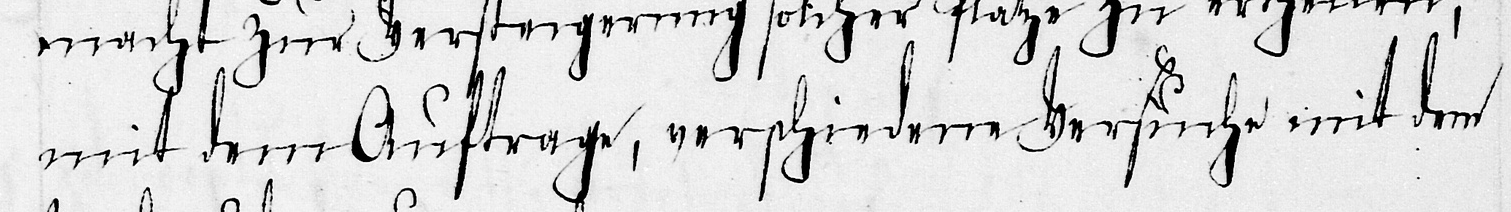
mit dem Auftrage, verschiedene Versuche mit dem
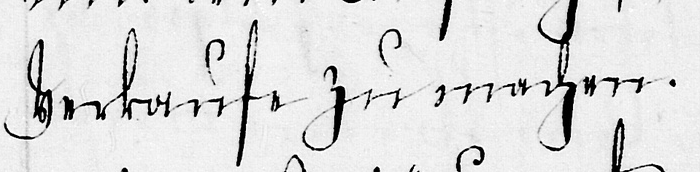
Verkaufe zu machen.
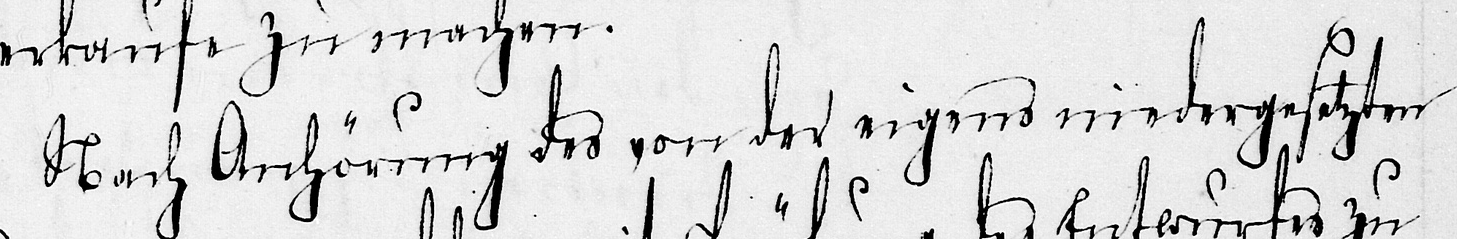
Nach Anhörung des von der eigens niedergesetzten
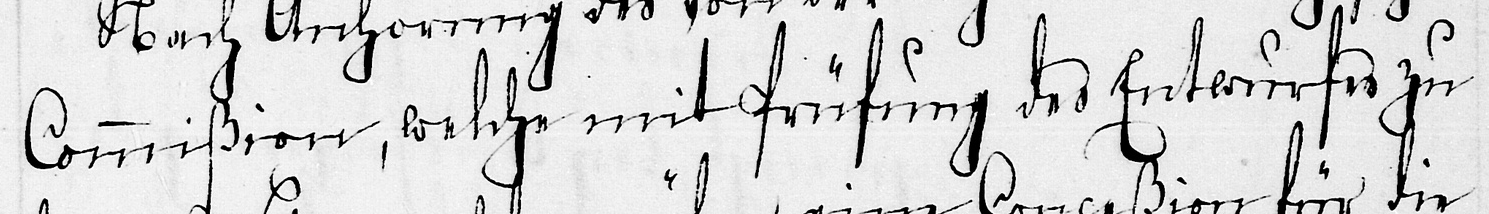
Commißion, welche mit Prüfung des Entwurfes zu
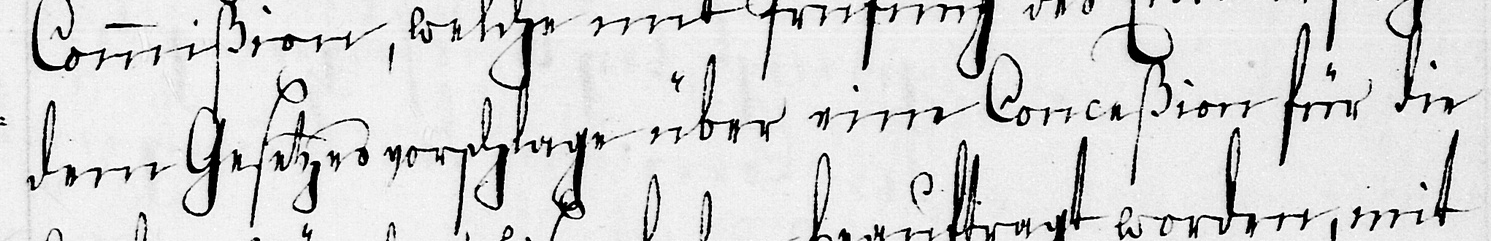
dem Gesetzesvorschlage über eine Conceßion für die
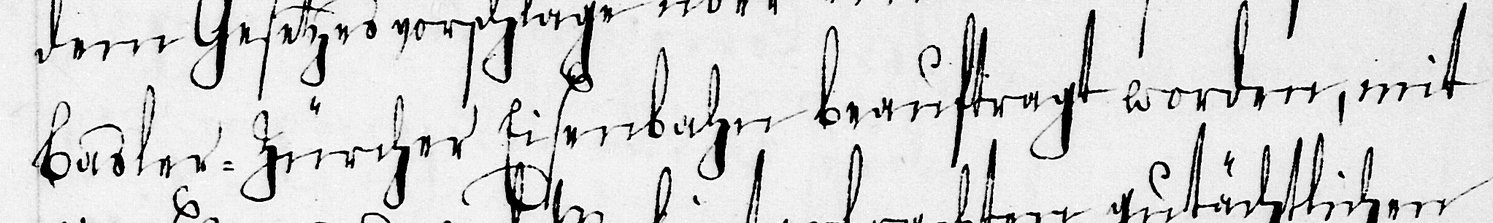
Basler-Zürcher Eisenbahn beauftragt worden, mit
